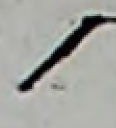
I
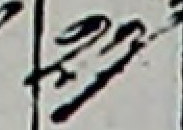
27
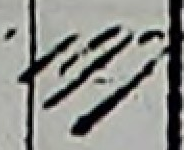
197
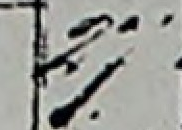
27
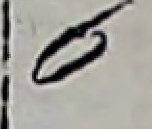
6
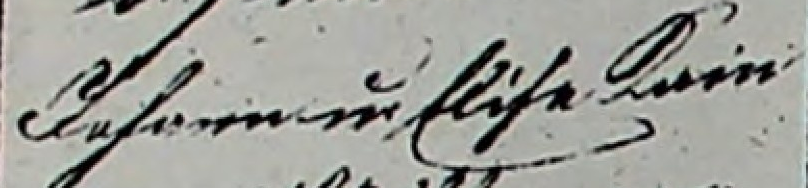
Johann u. Elise Kain
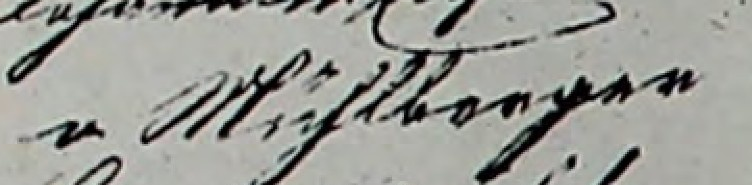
v. Mühlberger
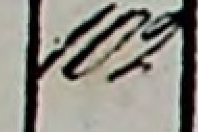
102
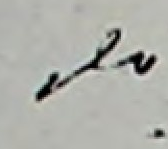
do
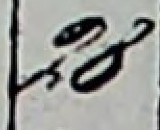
28
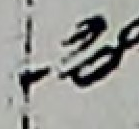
28
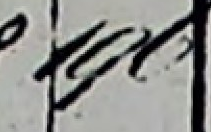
196
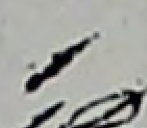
1
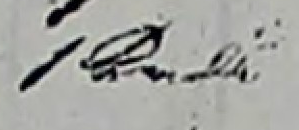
Kalb
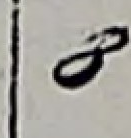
8
